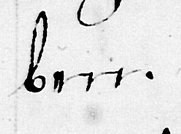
ben.
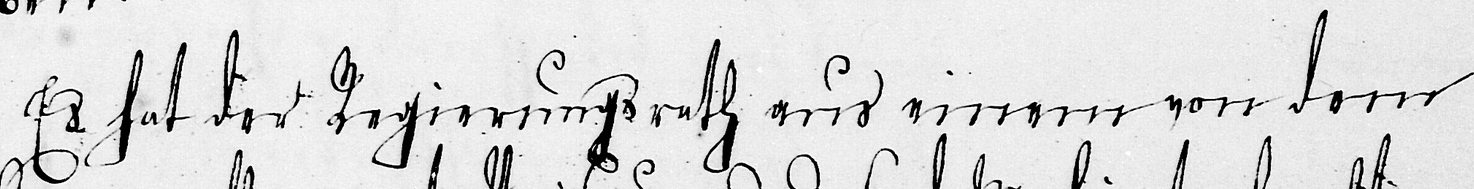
Es hat der Regierungsrath aus einem von dem
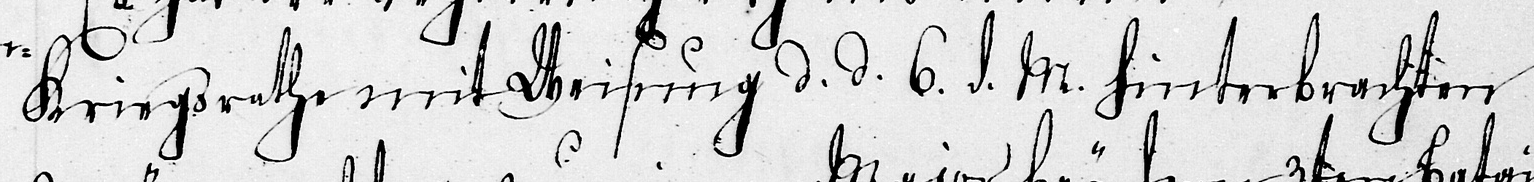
Kriegsrathe mit Weisung d. d. 6. d. M. hinterbrachten
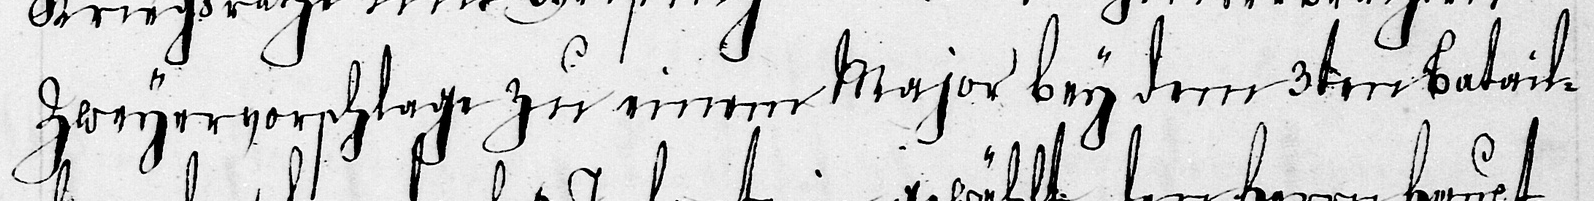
Zweyervorschlage zu einem Major bey dem 3ten Batail¬
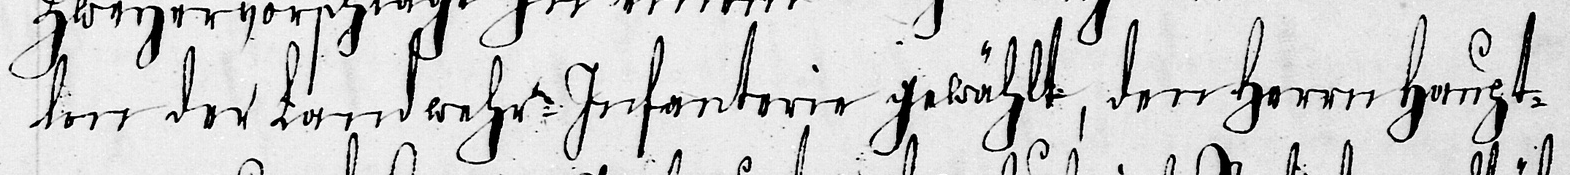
lon der Landwehr-Infanterie gewählt, den Herrn Haupt¬
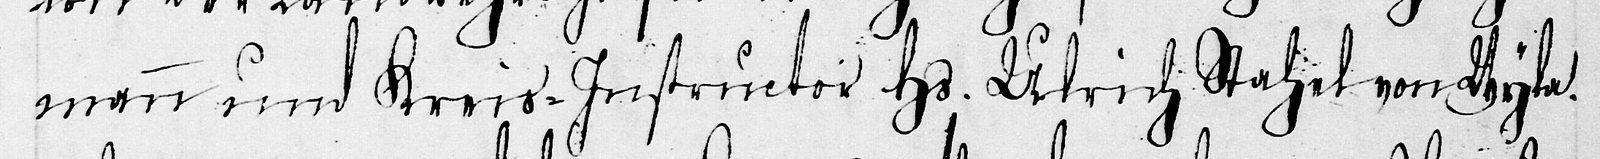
mann und Kreis-Instructor Hs. Ulrich Stahel von Wyla.
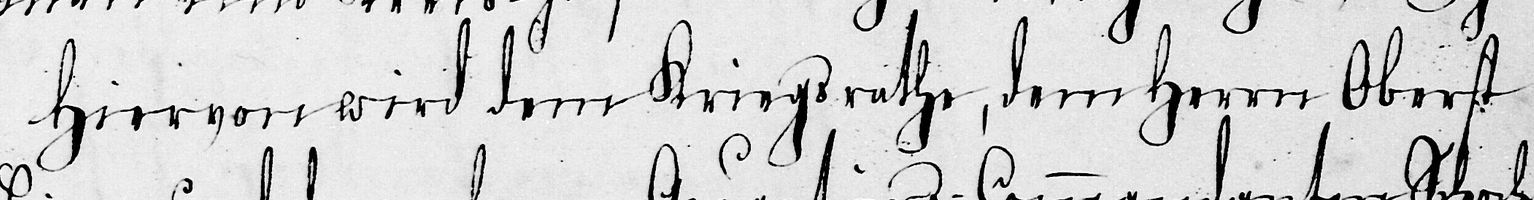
Hiervon wird dem Kriegsrathe, dem Herrn Oberst
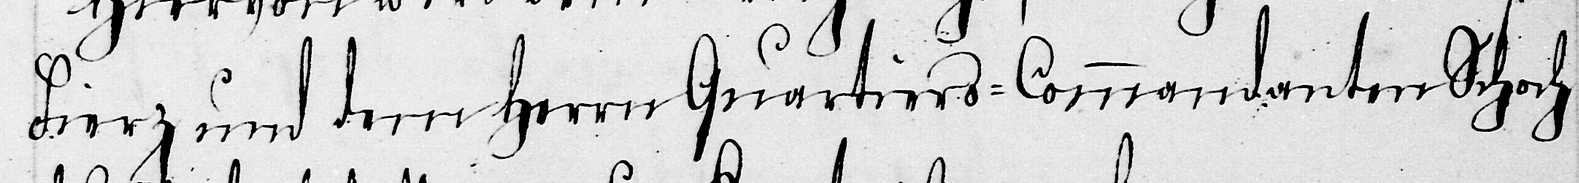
Fierz und dem Herrn Quartiers-Commandanten Schoch
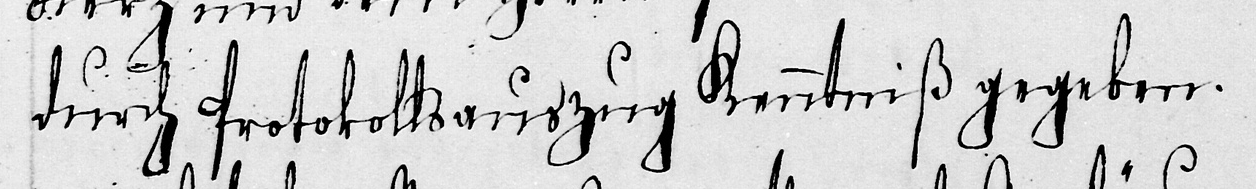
durch Protokollsauszug Kenntniß gegeben.
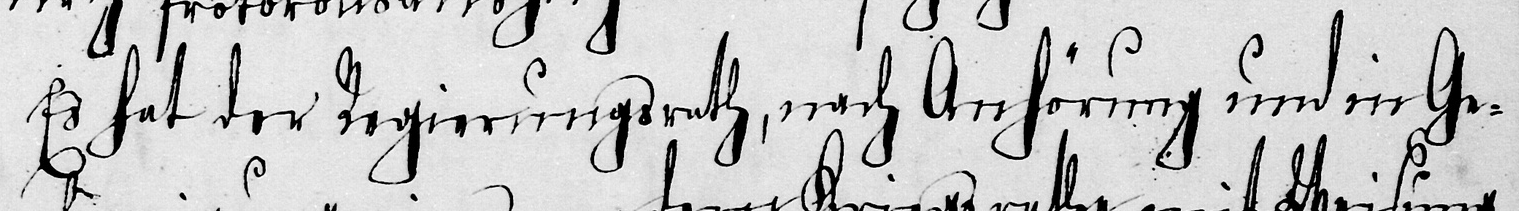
Es hat der Regierungsrath, nach Anhörung und in Ge¬
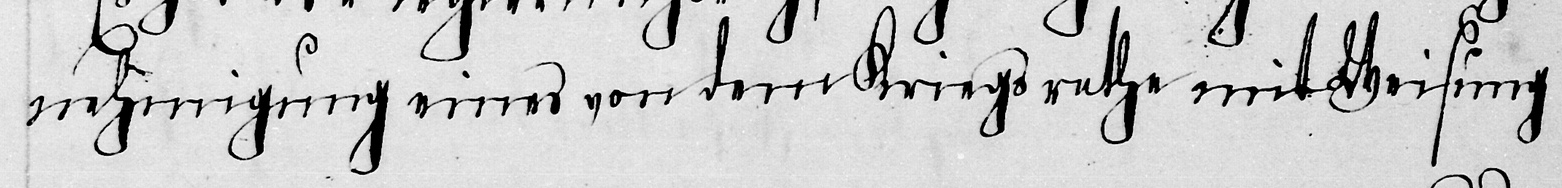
nehmigung eines von dem Kriegsrathe mit Weisung
